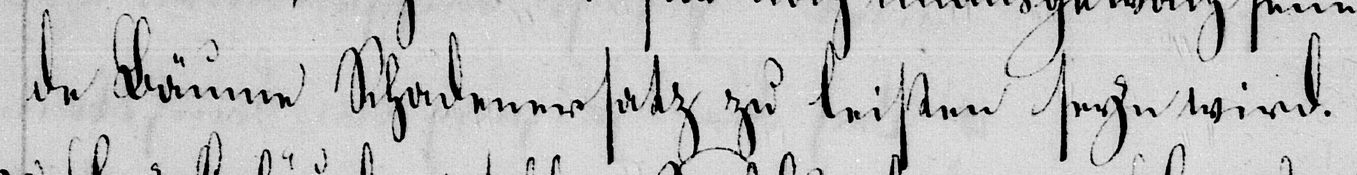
de Bäume Schadenersatz zu leisten seyn wird.
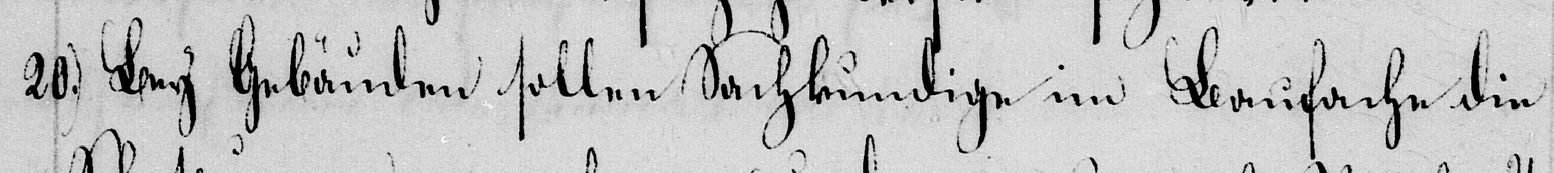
20.) Bey Gebäuden sollen Sachkundige im Baufache die
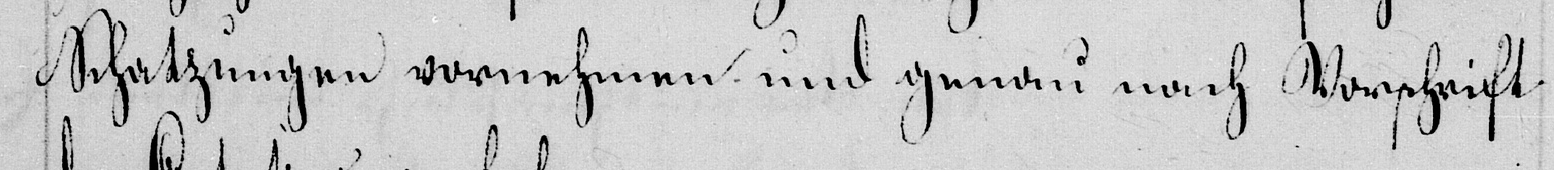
Schatzungen vornehmen und genau nach Vorschrift
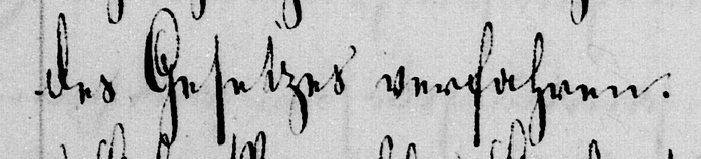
des Gesetzes verfahren.
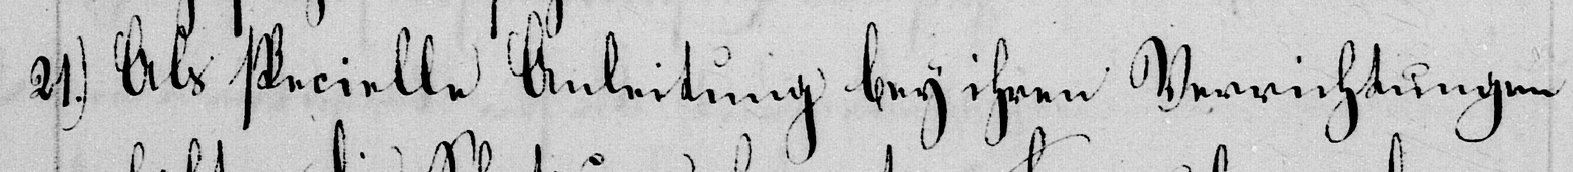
21.) Als specielle Anleitung bey ihren Verrichtungen
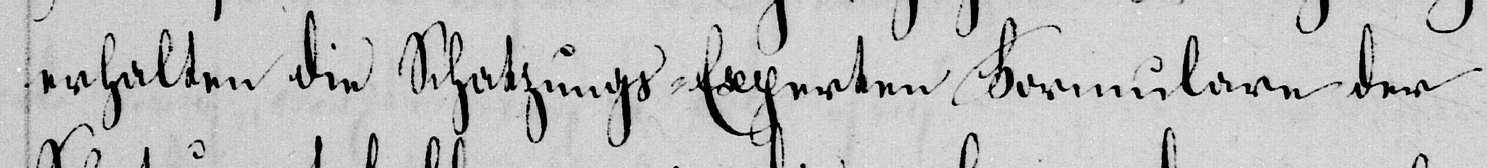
erhalten die Schatzungs-Experten Formulare der
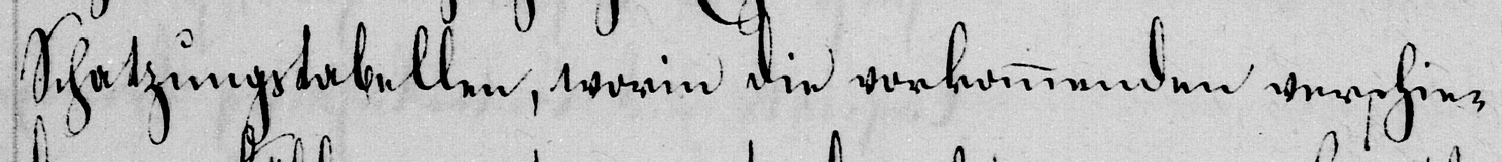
Schatzungstabellen, worin die vorkommenden verschie¬
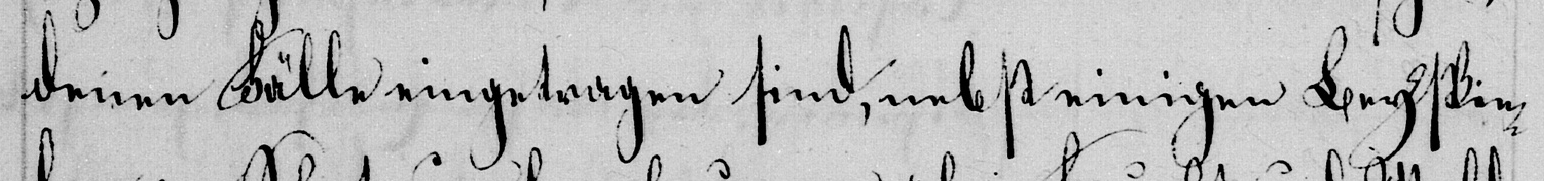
denen Fälle eingetragen sind, nebst einigen Beyspie¬
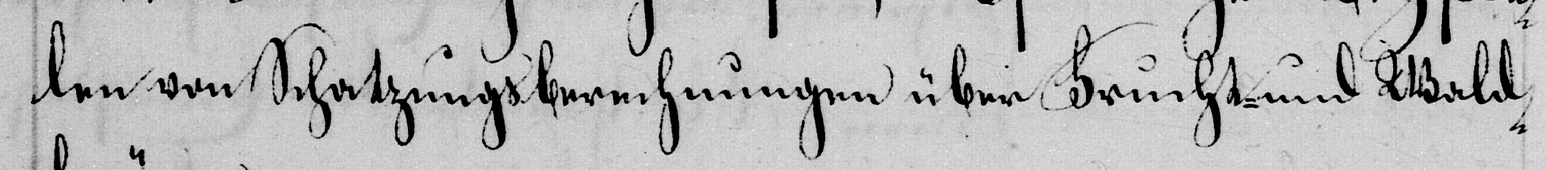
len von Schatzungsberechnungen über Frucht- und Wald¬
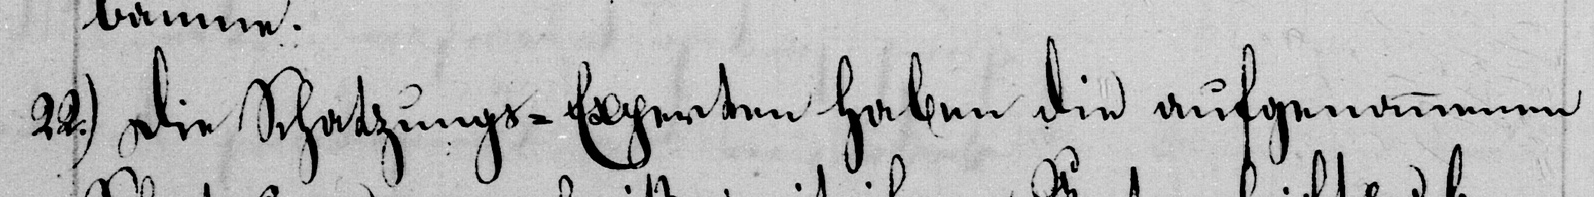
22.) Die Schatzungs-Experten haben die aufgenommenen
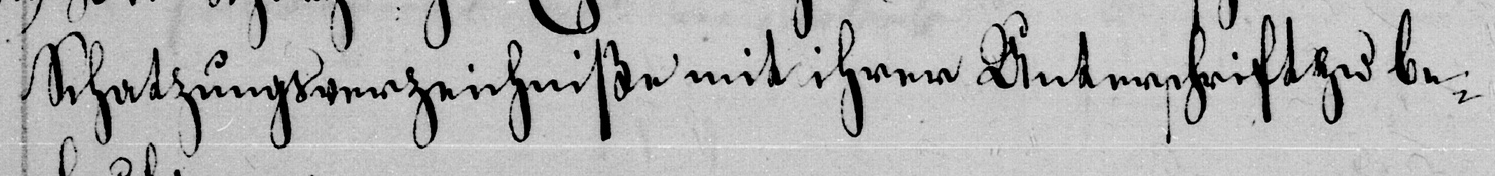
Schatzungsverzeichniße mit ihrer Unterschrift zu be¬
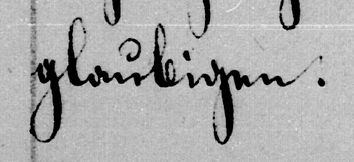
glaubigen.
